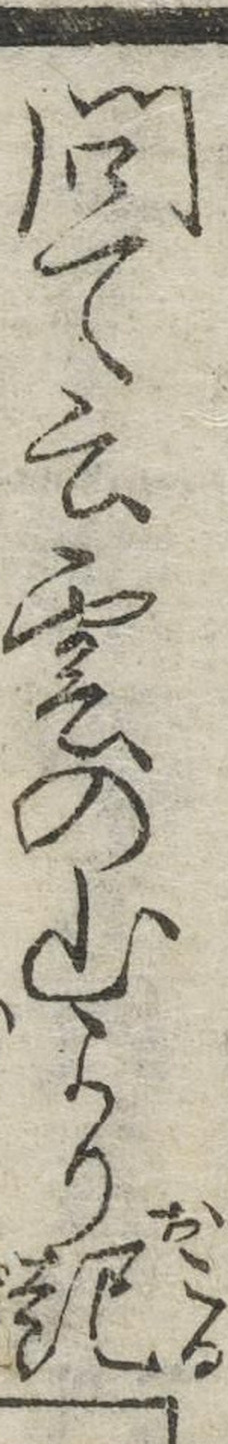問て云雲の山より起
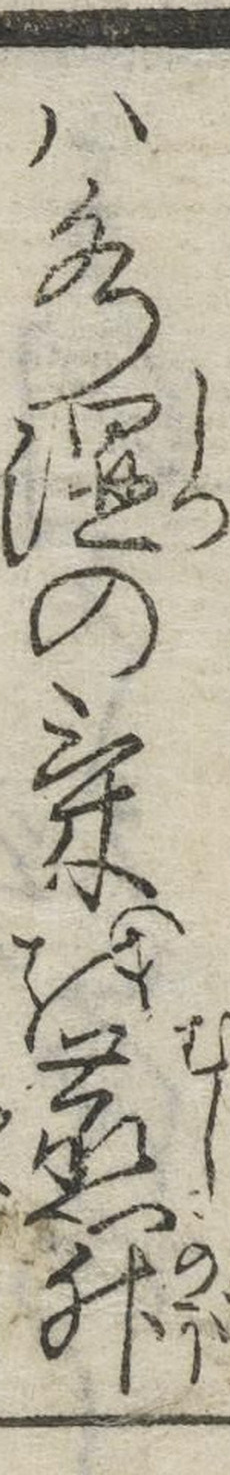ハ水湿の気を蒸升
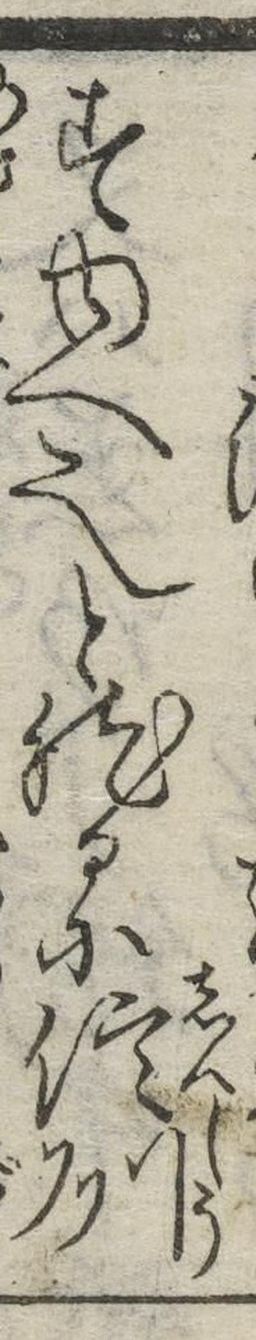すゆへ也と然るに信州
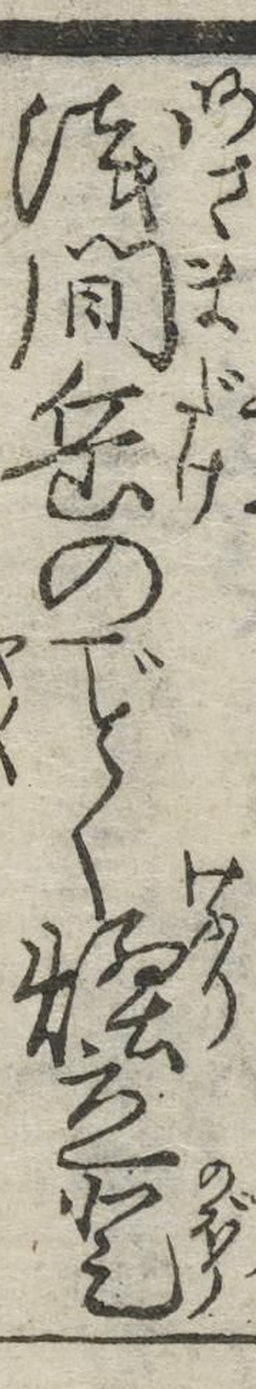浅間岳のごとく煙立登
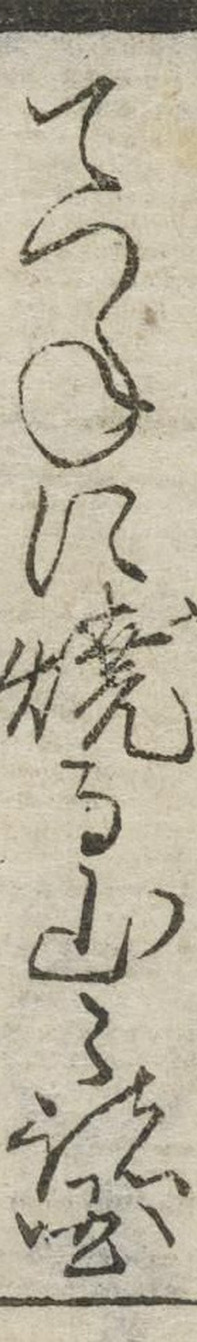てつねに焼る山々諸国
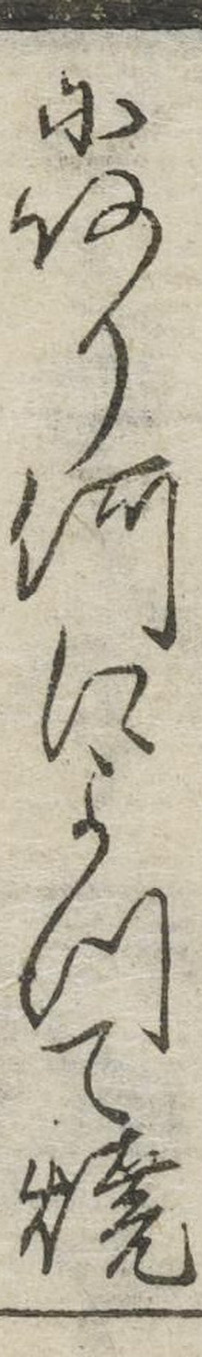にあり何によつて焼
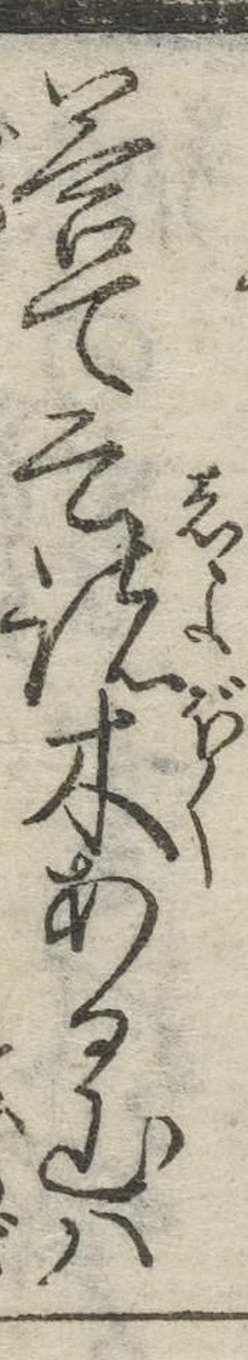答て云諸木ある山ハ
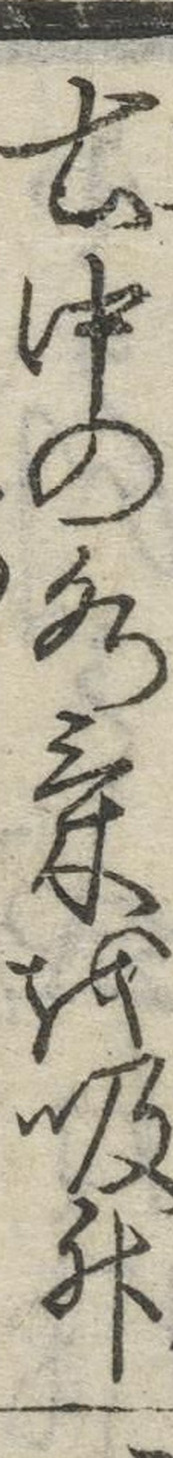土中の水気を吸升
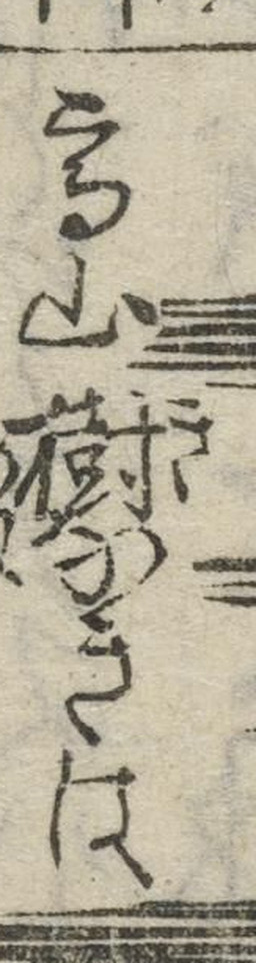高山樹なきは
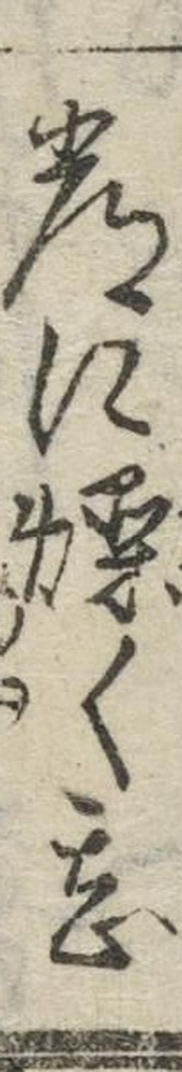常に燥く甚
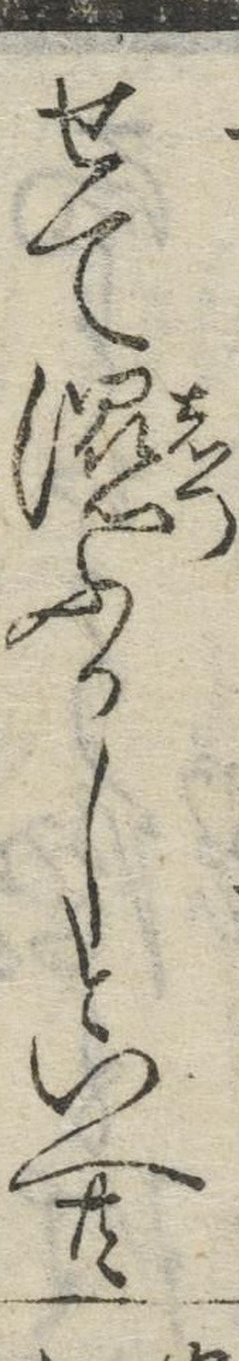せて湿ふかしといへ共
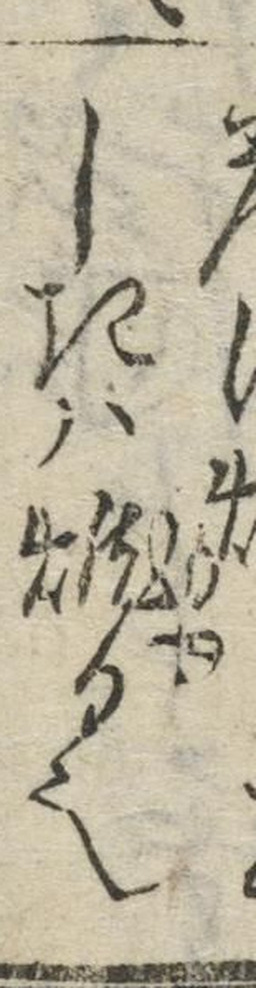しきは燃る也
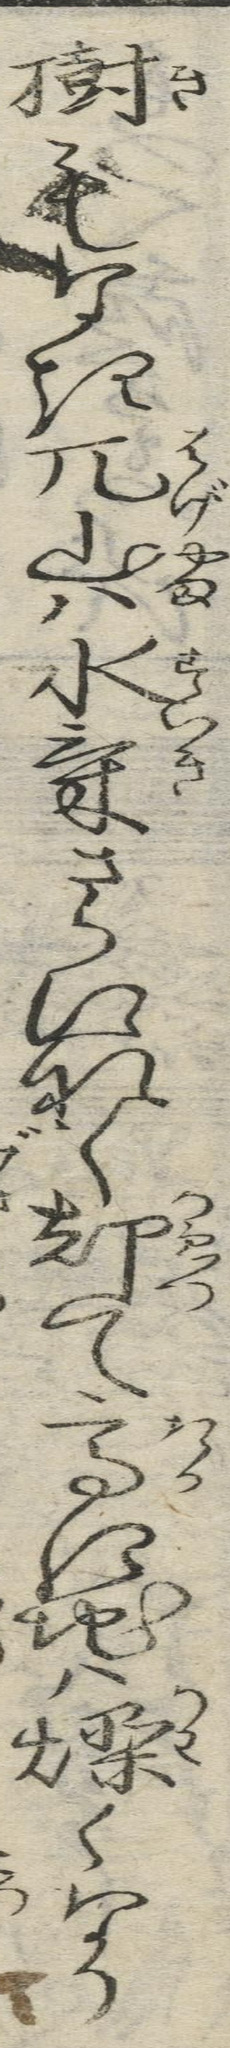樹もなき兀山ハ水気さらになく却て高き地ハ燥くなり
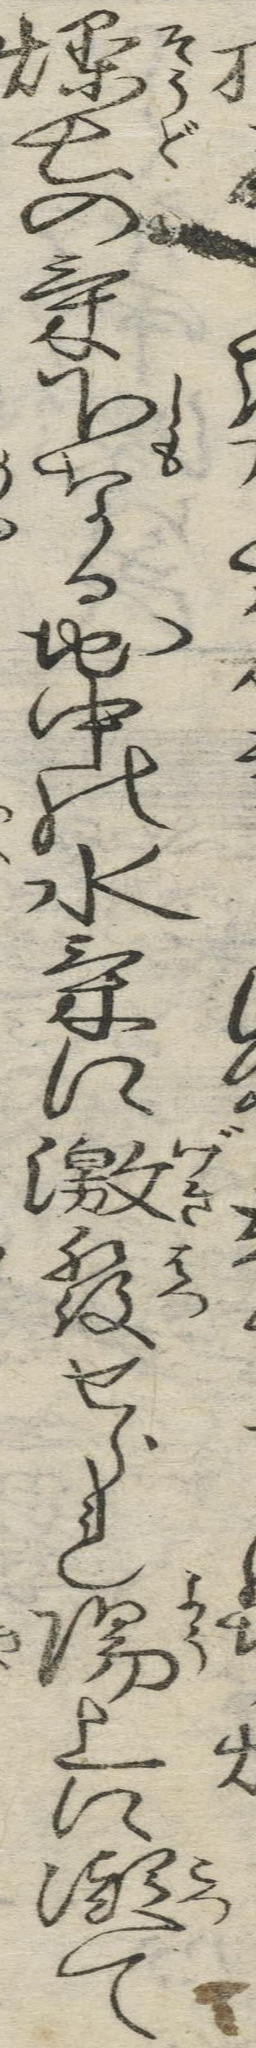燥土の気下なる地中の水気に激発セられ陽上に凝て
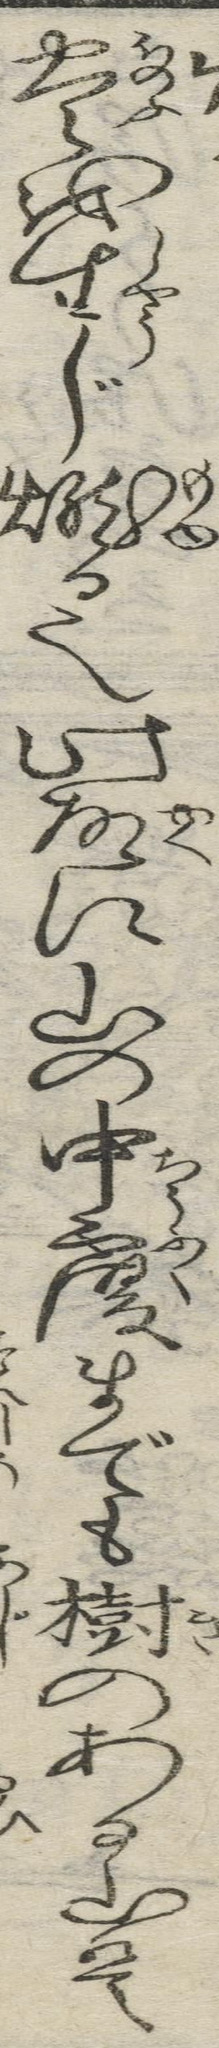炎を生じ燃る也此故に山の中覆までも樹のある山是
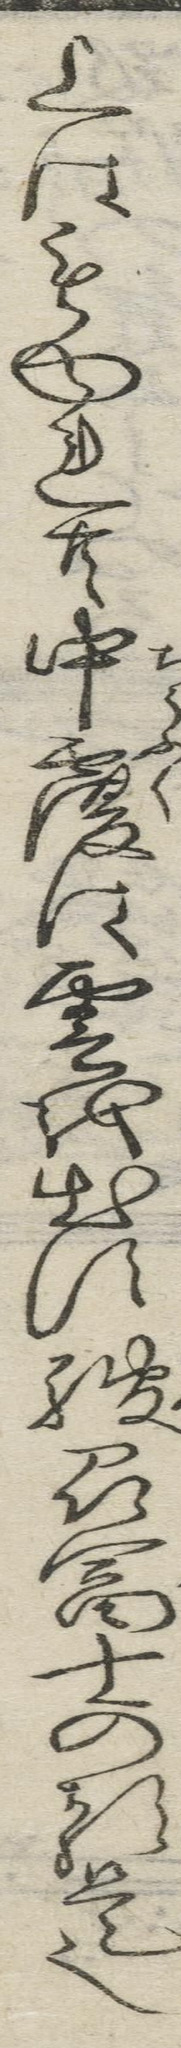上はもゆれ共中覆は雲を出す駿州富士の類是也
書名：訓蒙天地辨　地
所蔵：東京大学地震研究所図書室 Earthquake Research Institute Library, The University of Tokyo, JAPAN
